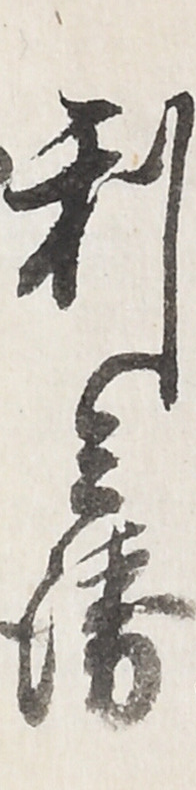利兵衛
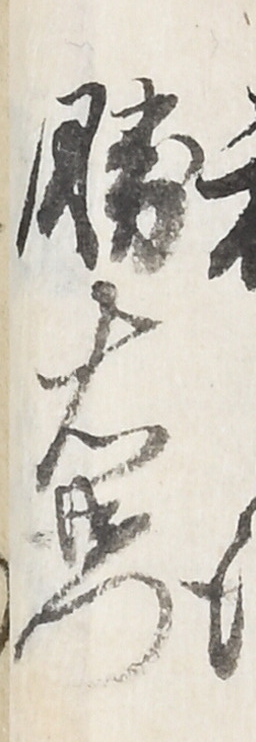勝右衛門
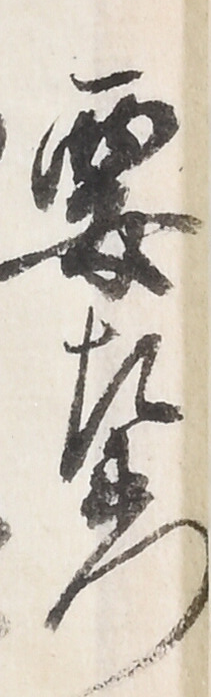要左衛門
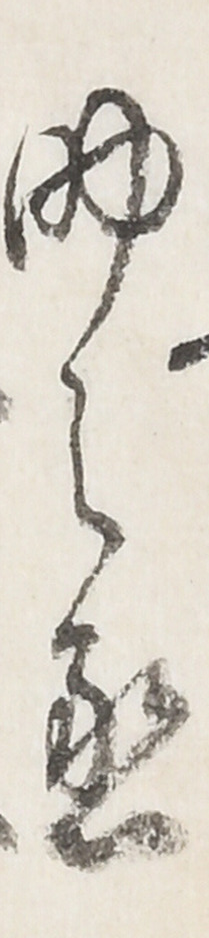助之丞
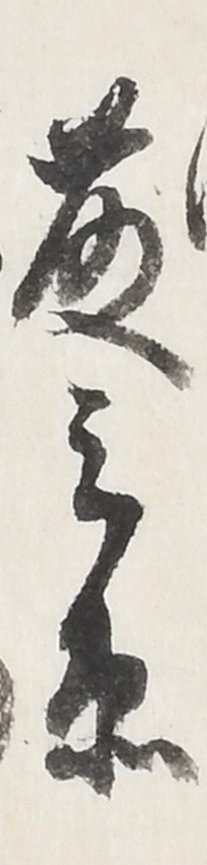藤兵衛
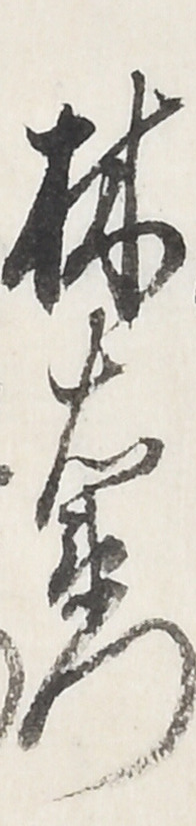林右衛門
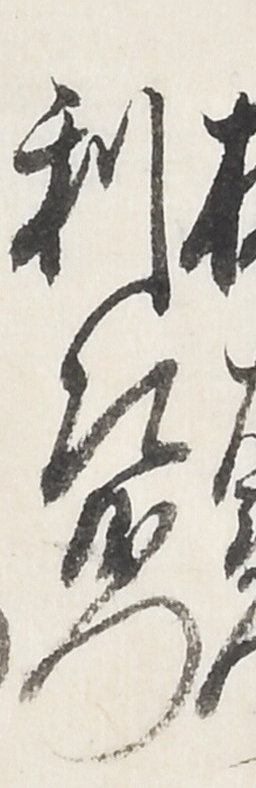利左衛門
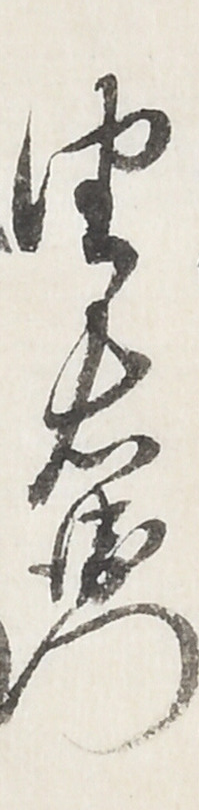由右衛門
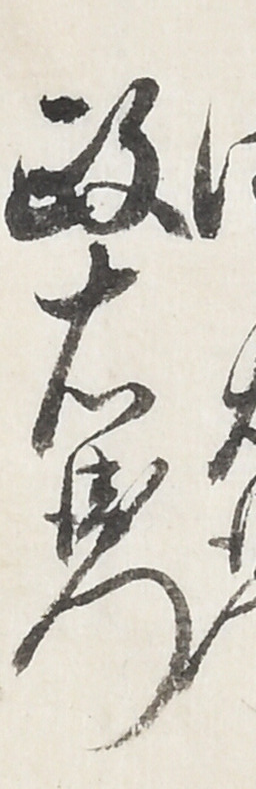孫右衛門
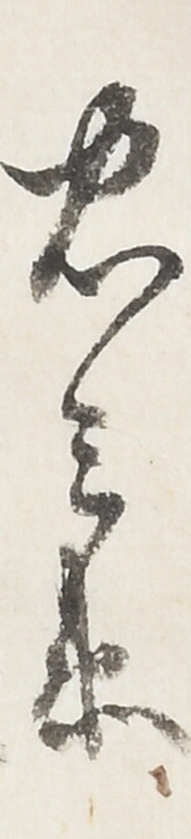忠兵衛
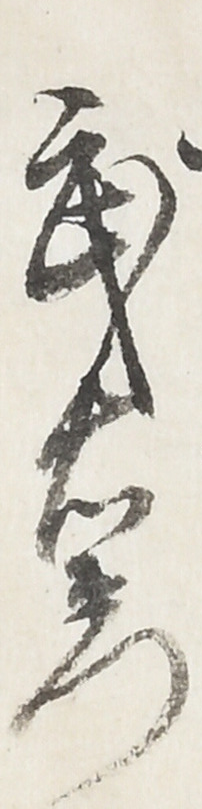武右衛門
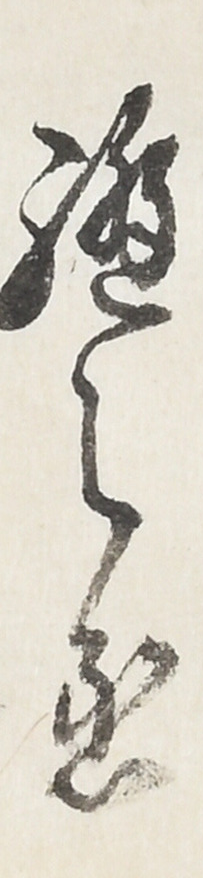縫之丞

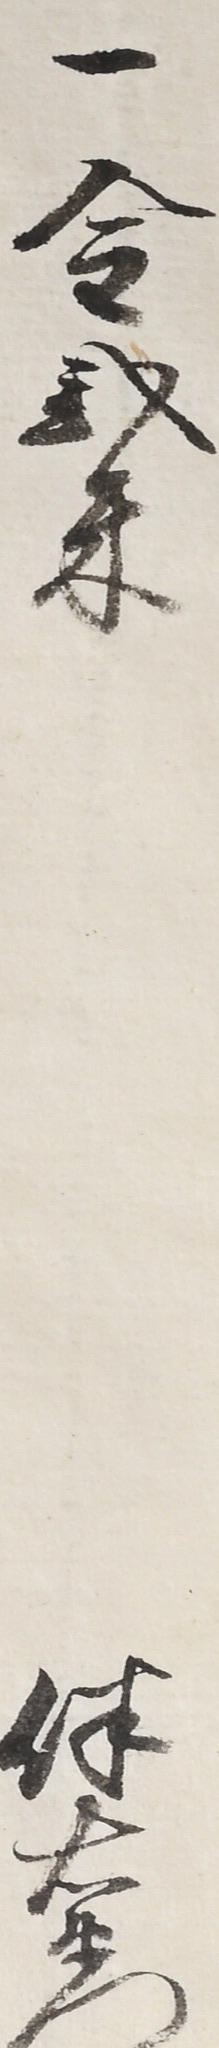一金弐朱伴右衛門
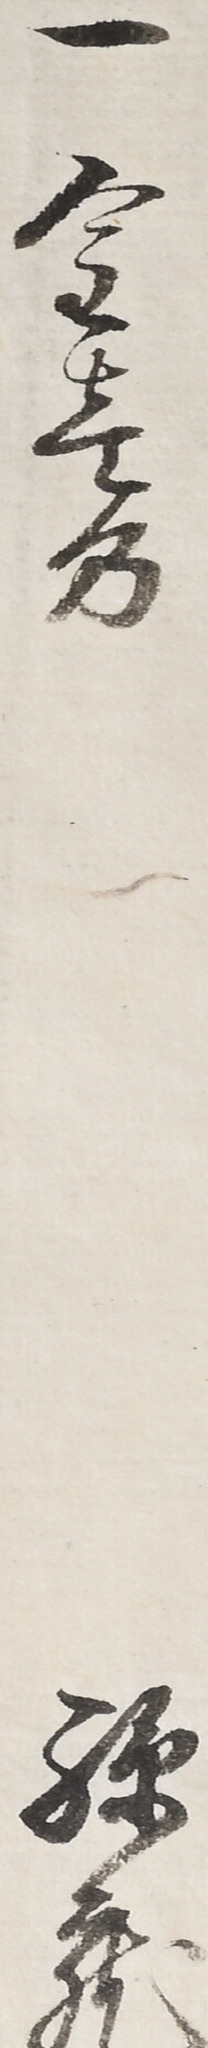一金壱分孫蔵
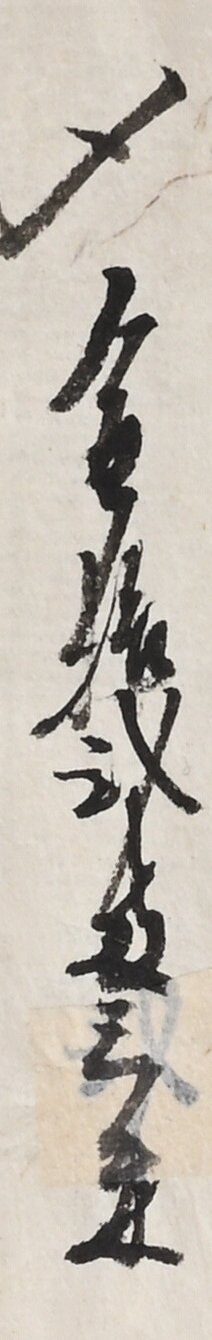〆金拾弐両三朱
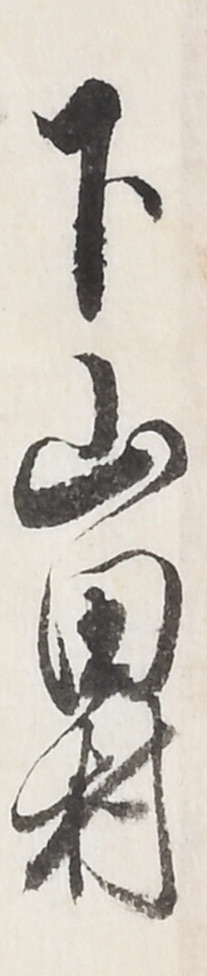下山田村
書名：御拝地百五拾年御祝儀献上御目録名前
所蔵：伊那市立高遠町図書館・合同会社AMANE
